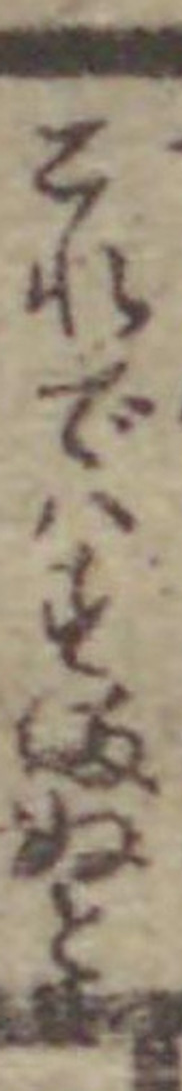これでハすまぬと
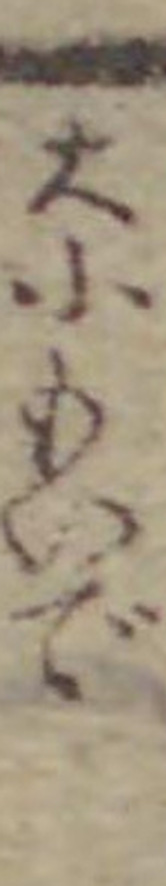大小もいで
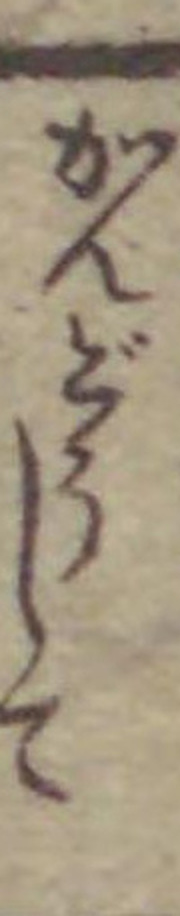かんどうして
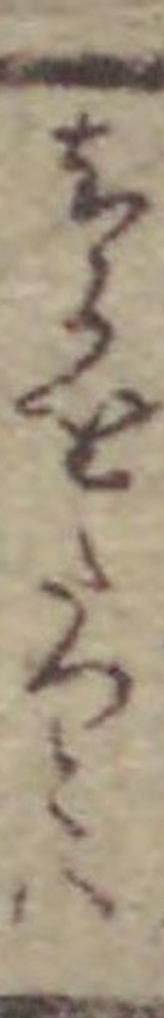はらをたつとハ
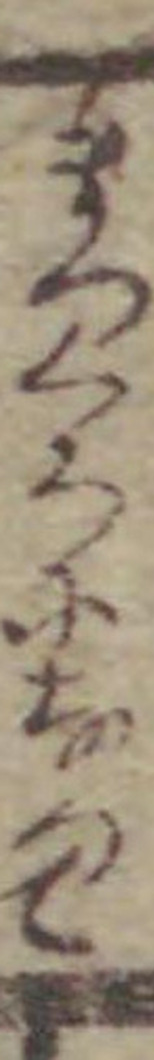まつくろになつて
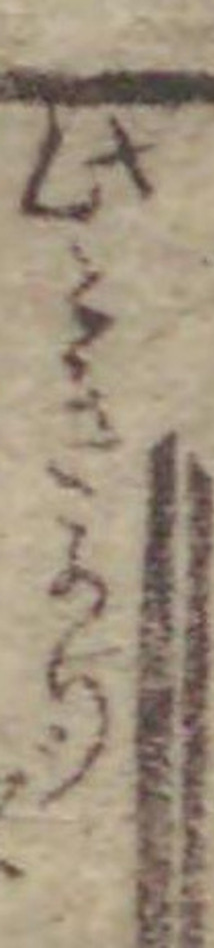此ときよりぞ

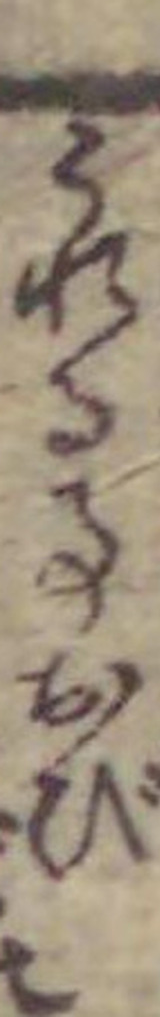うれる事おび
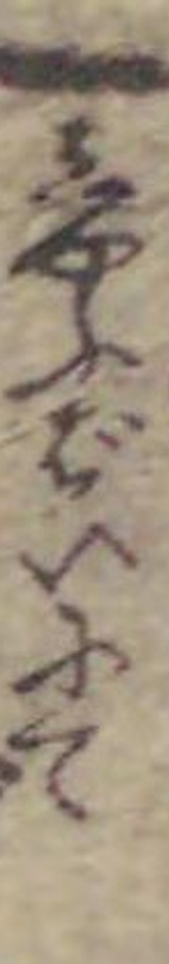しやふばいにて
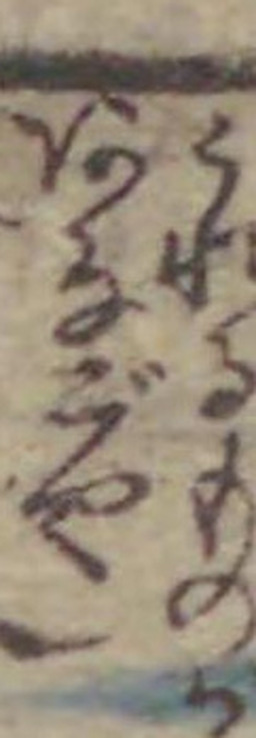あなごや
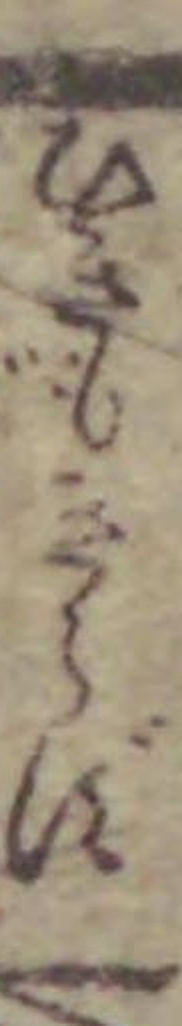ひきもきらず
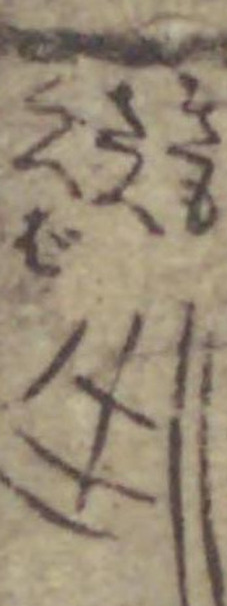くへば
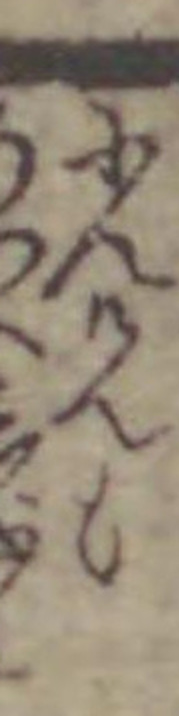にんけんも
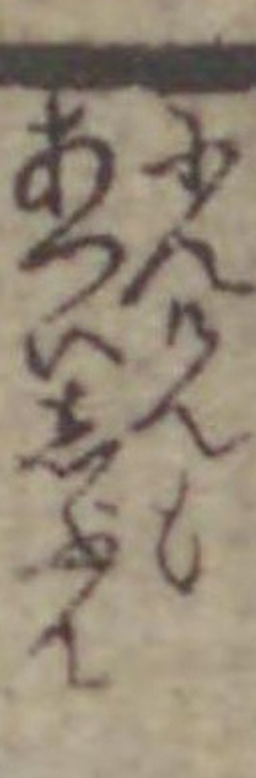あついしぶん
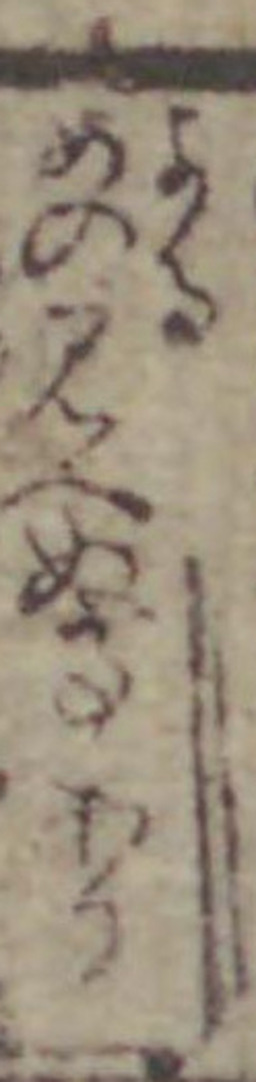めの見へぬ事あり
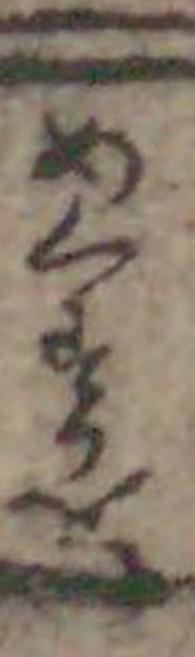めくすりを
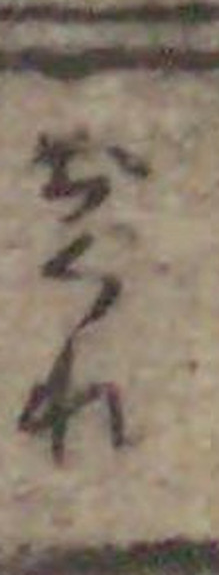おくれ
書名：烏行水諺草 3巻
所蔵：国立国会図書館 National Diet Library, JAPAN
